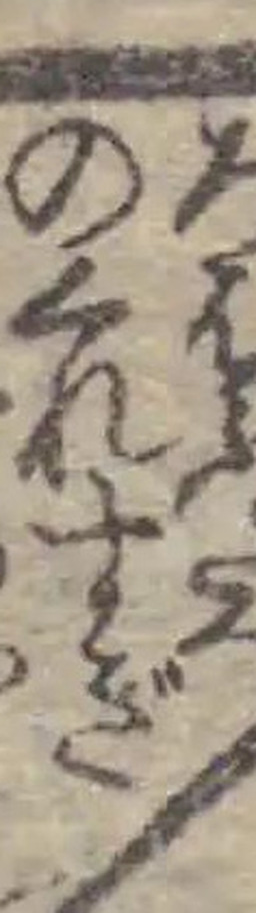のくれすぎ
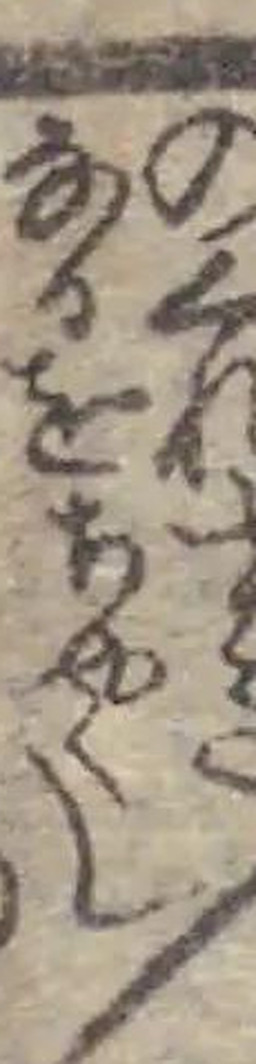なるをちやくし
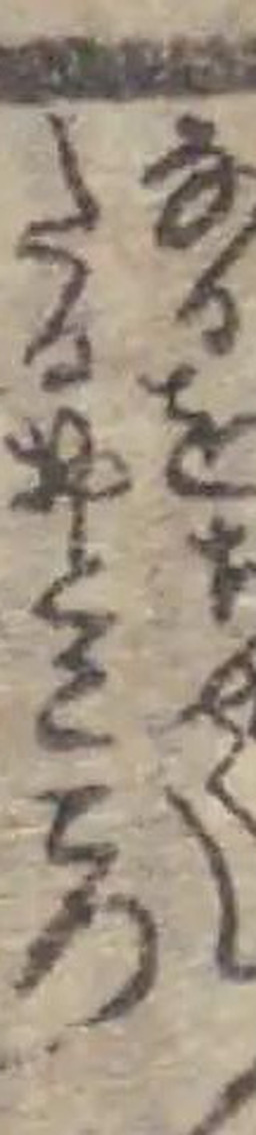たるおとここつ
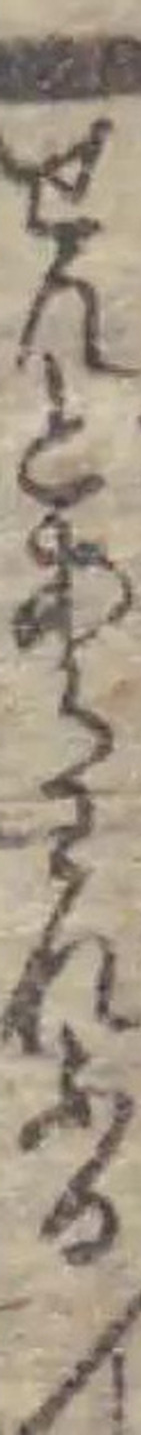せんとあらわれふる
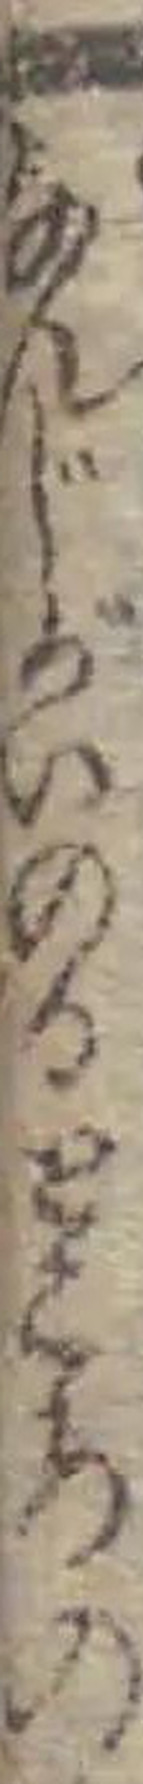なんじがいのるところの
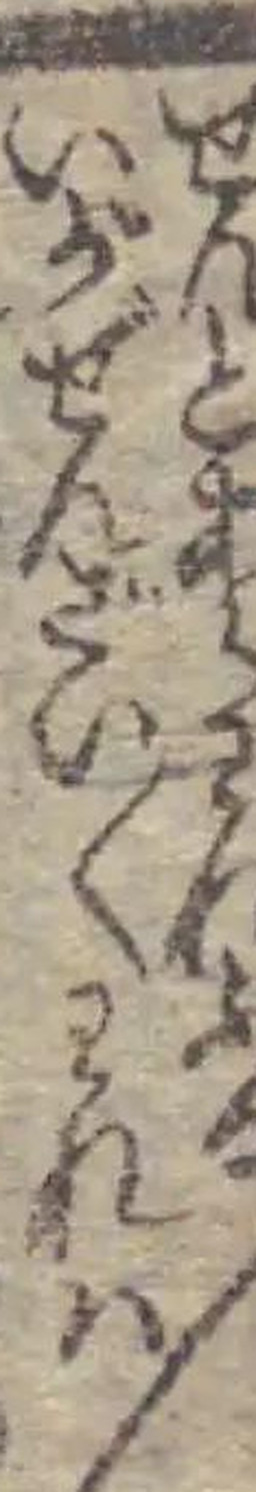いがぜんざい〳〵われは
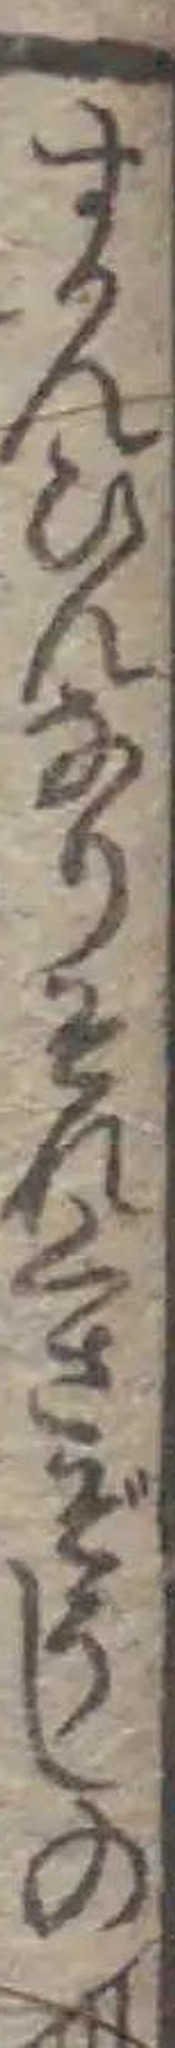すかんひんなりそれくさぞうしの
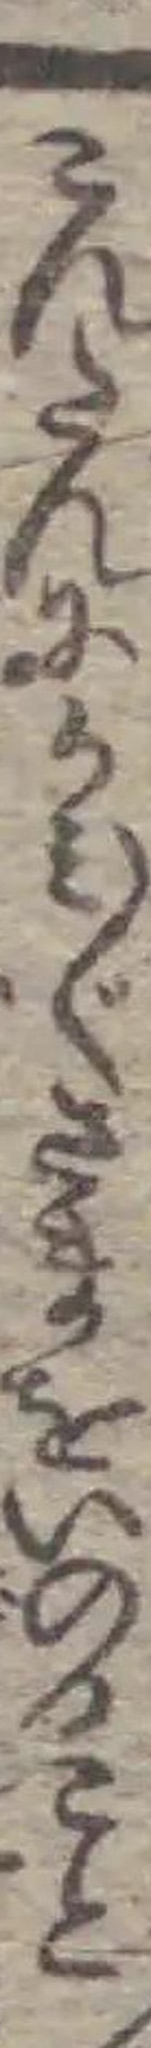こんたんにかみ〴〵さまをいのること
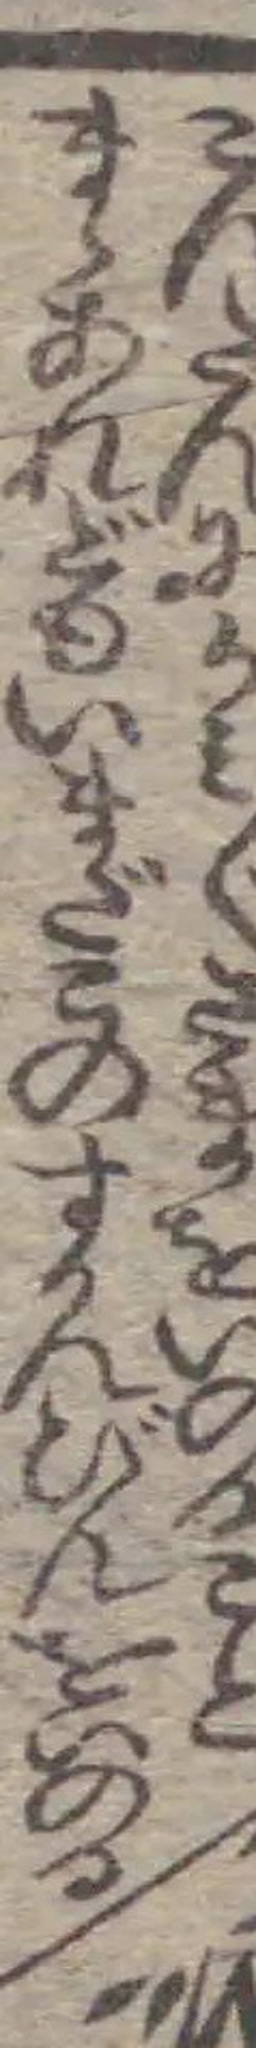まゝあれどもいまだこのすかんびんをいのる
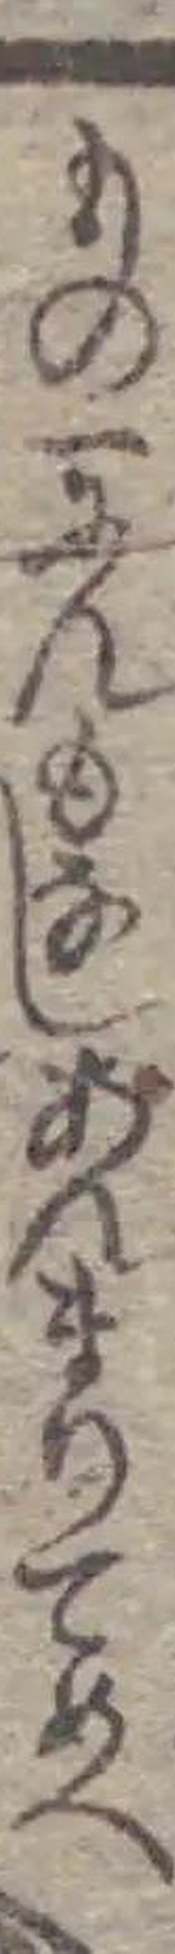もの一にんもなしあんまりてめへの
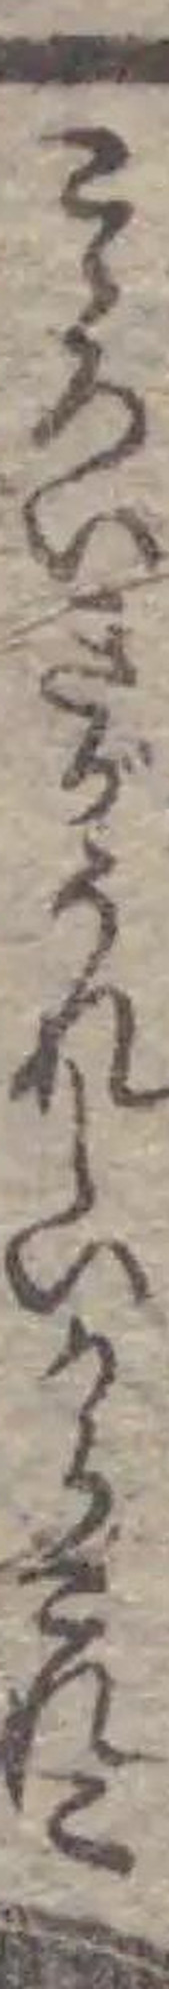こゝろいきがうれしいからこれこ
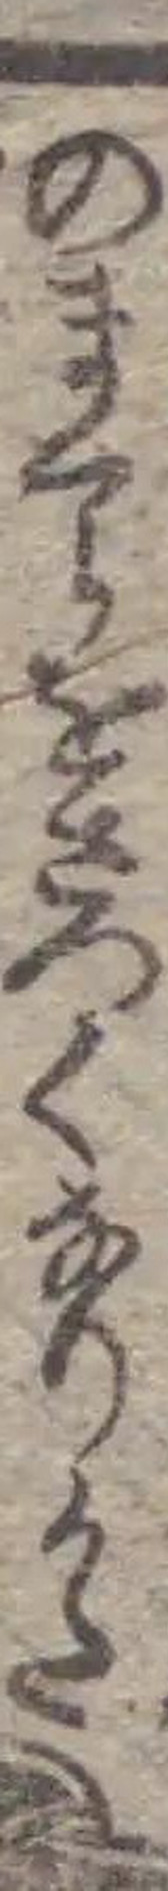のまくらをさつくなりかた
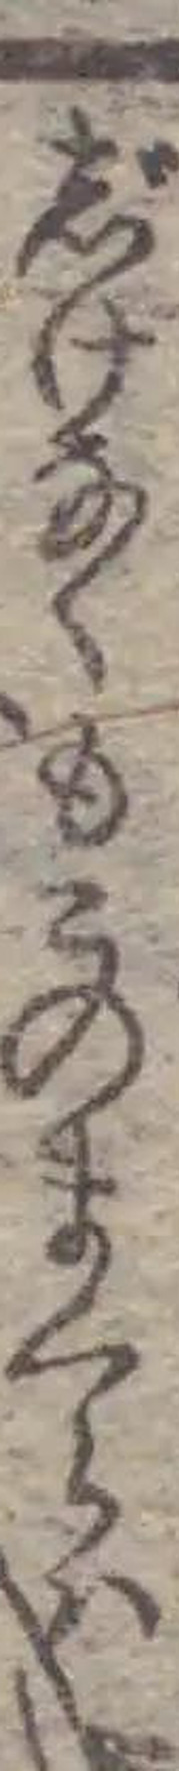じけなくもこのまくらは
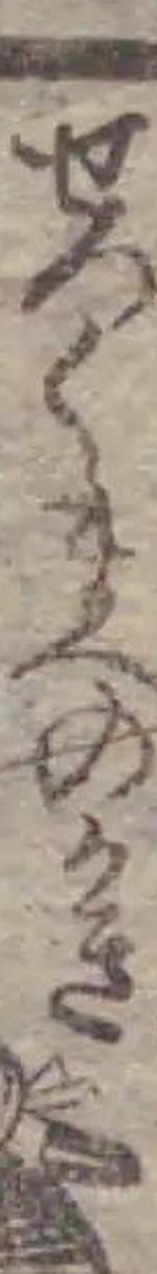せつくまへのかき
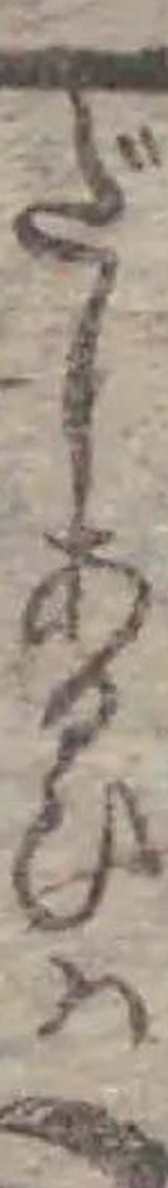だしあるひは
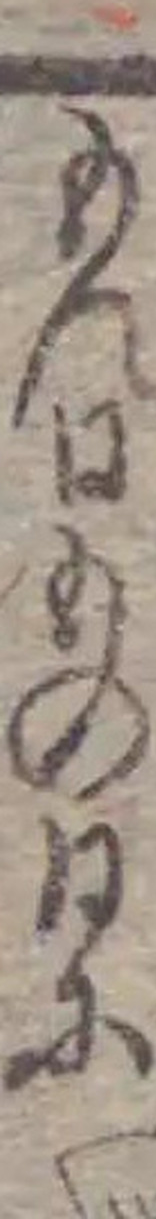もん日もの日に
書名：かんなんの夢枕 2巻
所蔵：国立国会図書館 National Diet Library, JAPAN
